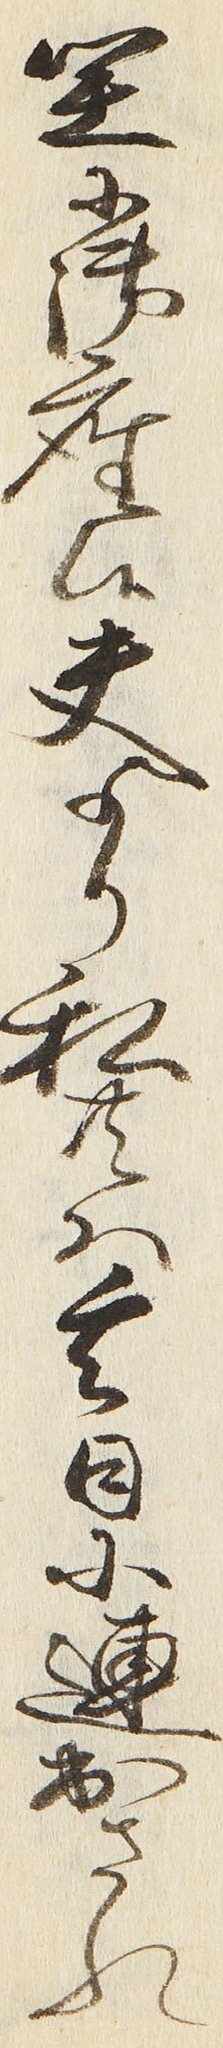閏に御座候夫より私共は其日に連出され
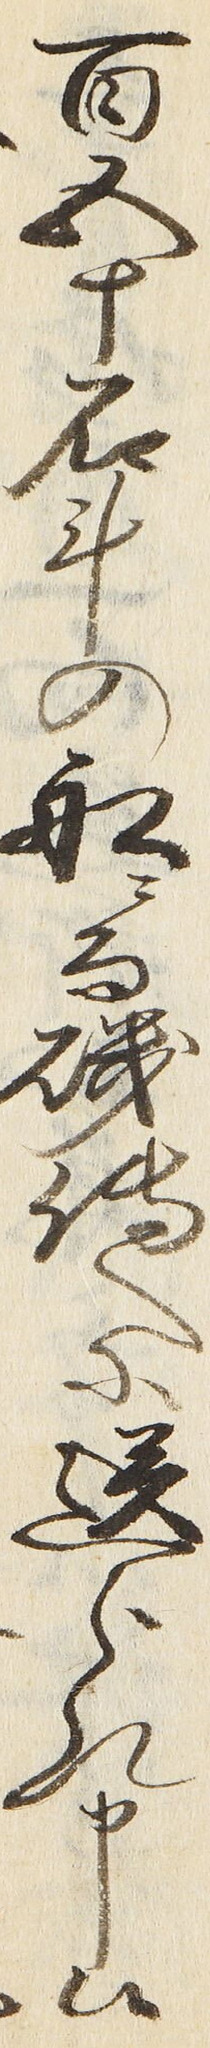百五十石計の船にて磯伝へに送られ申候
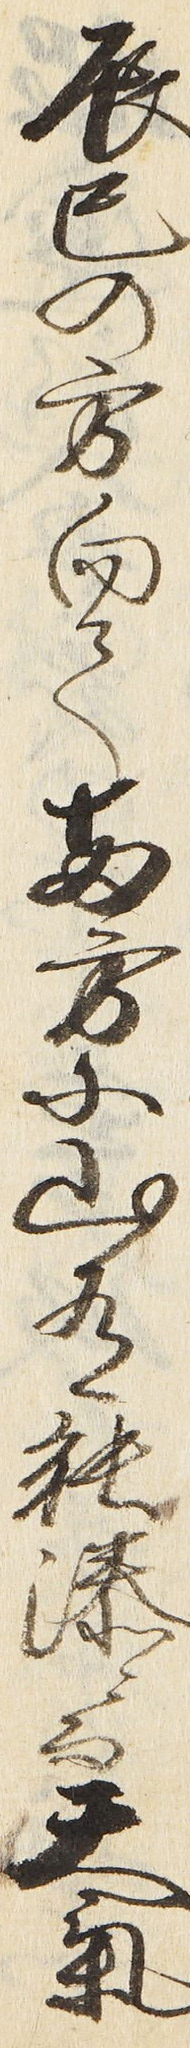辰巳の方向て南方に山有能湊にて天気
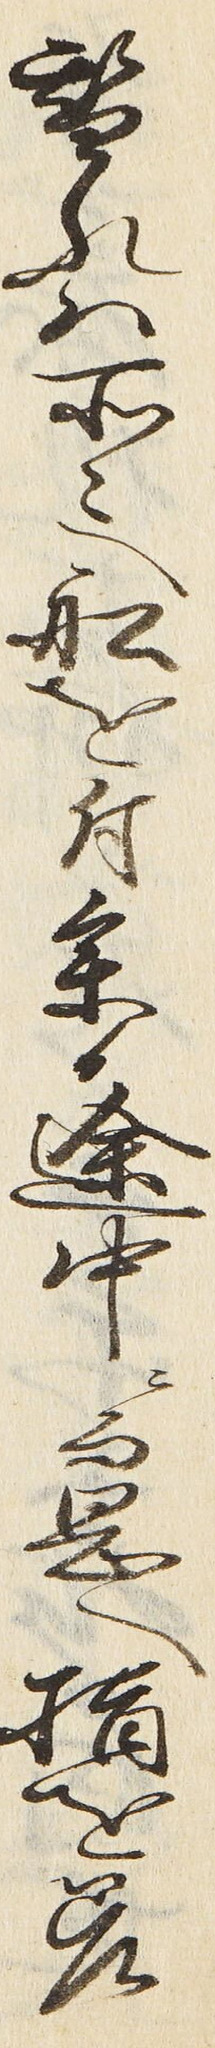替れは所々へ船を付参る途中にて岡へ指を差
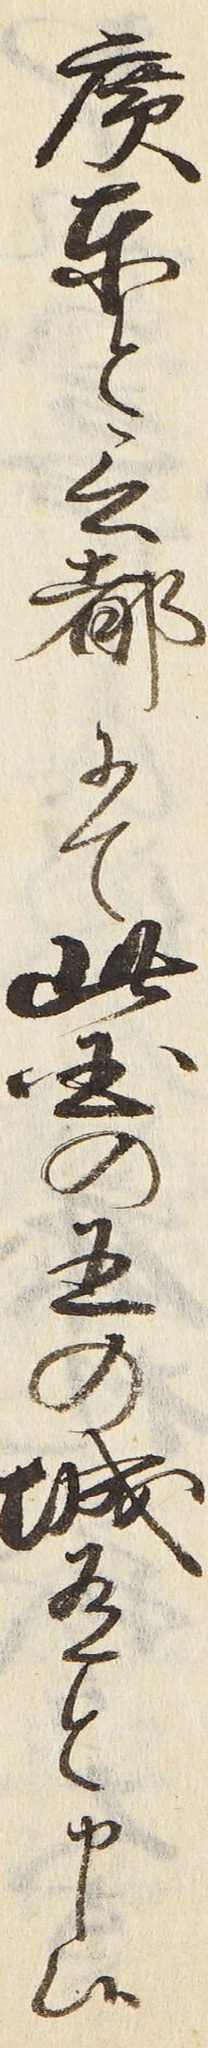廣東と云都にてこの此国の王の城有と申候
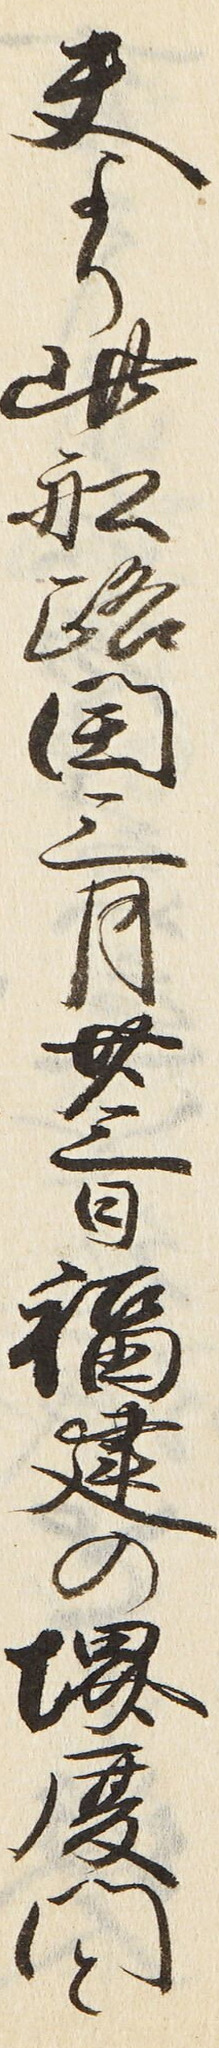夫より此船路閏三月廿三日福建の堺厦門と
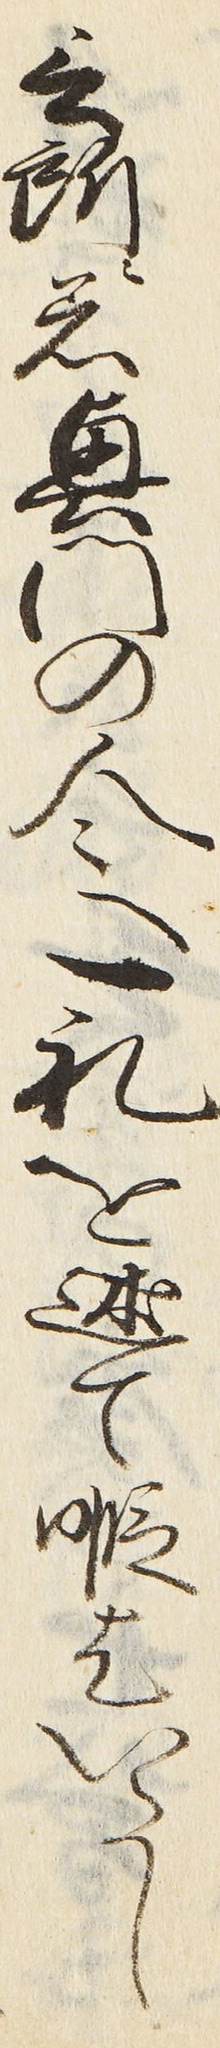云所に着奥門の人々へ一礼を述て暇乞いたし
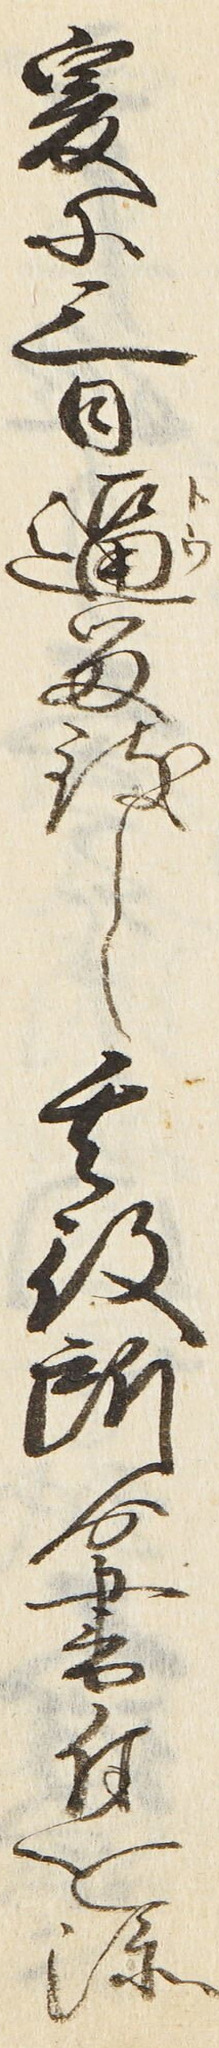爰に三日逗留致し其役所ゟ書付を添
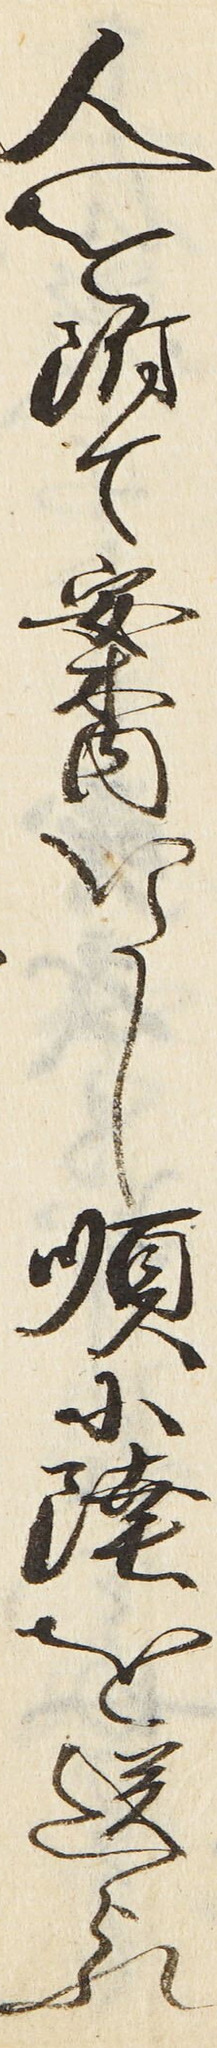人を附て案内いたし順に陸を送られ
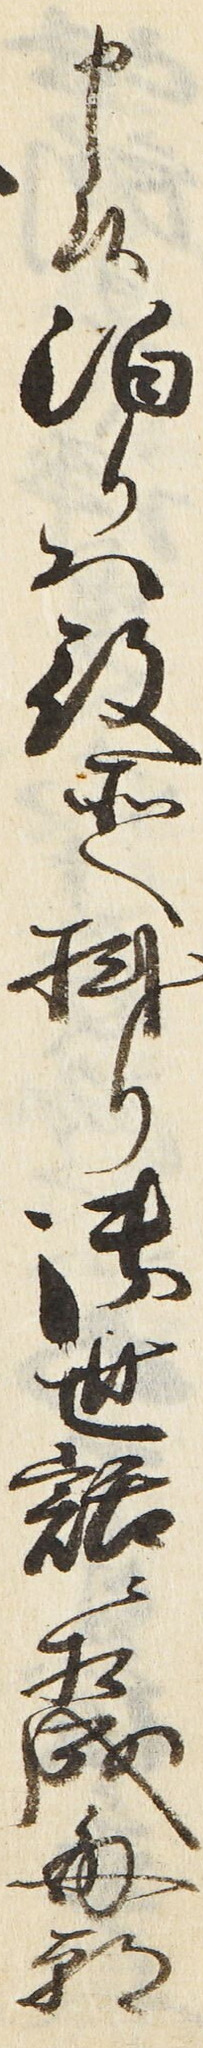申候泊りは役所へ掛り御世話に相成願
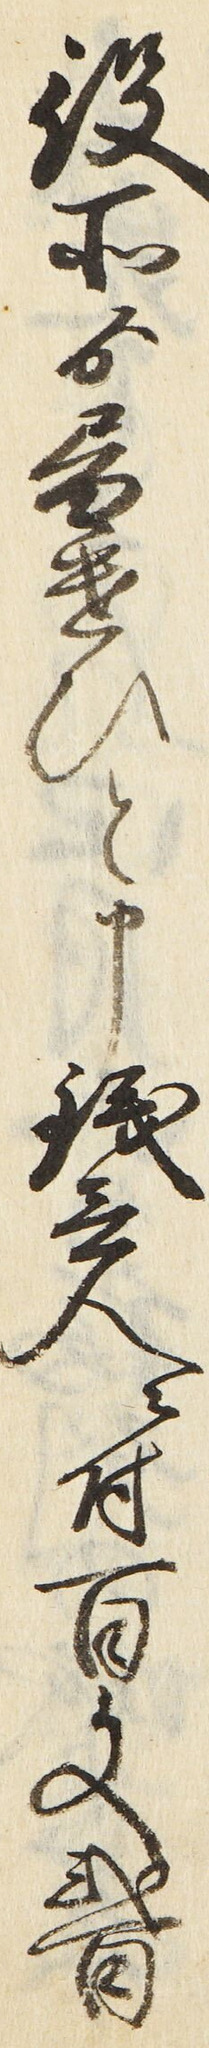役所届遣ひと申銭壱人に付百文弐百

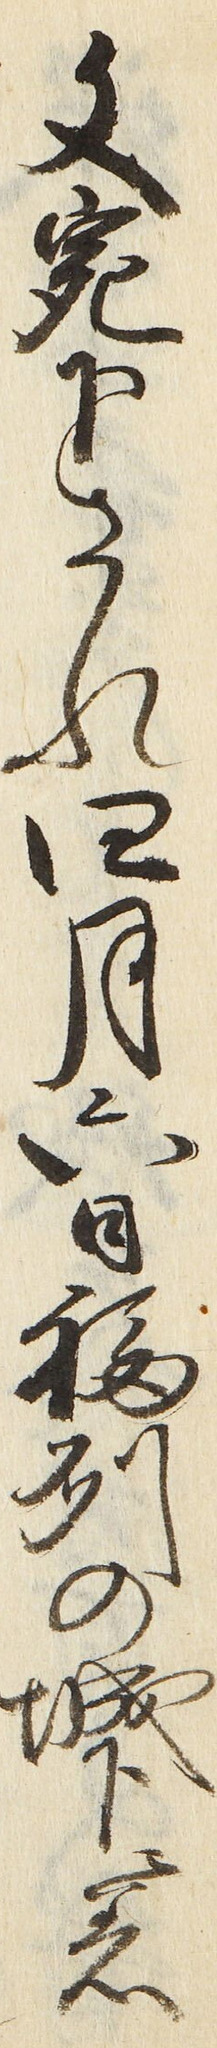文宛下され四月六日福州の城下に着
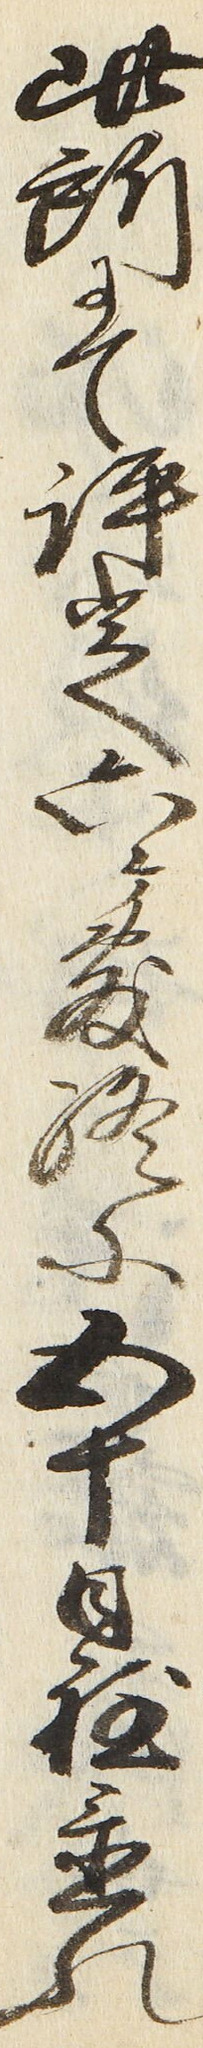此所にて評定六ヶ敷終に五十日程置れ
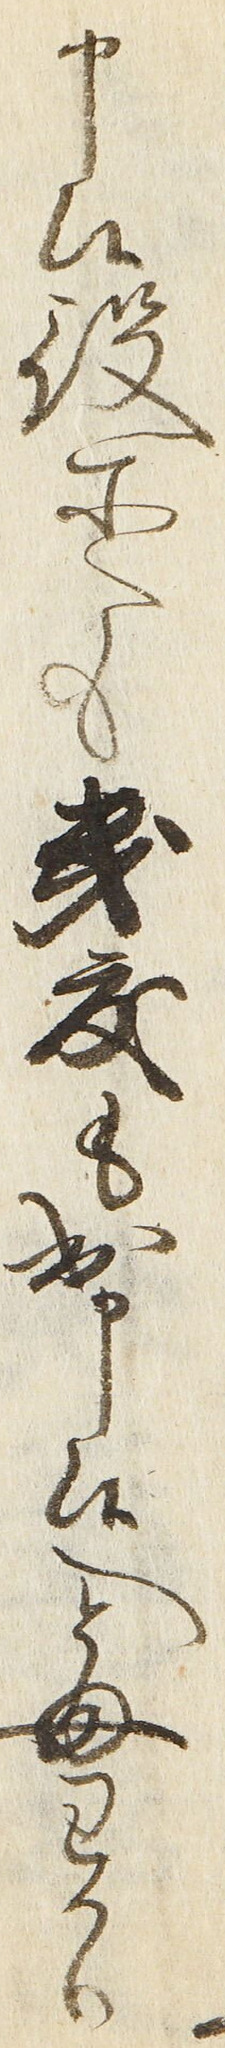申候役所へも幾度も出申候へともわかり
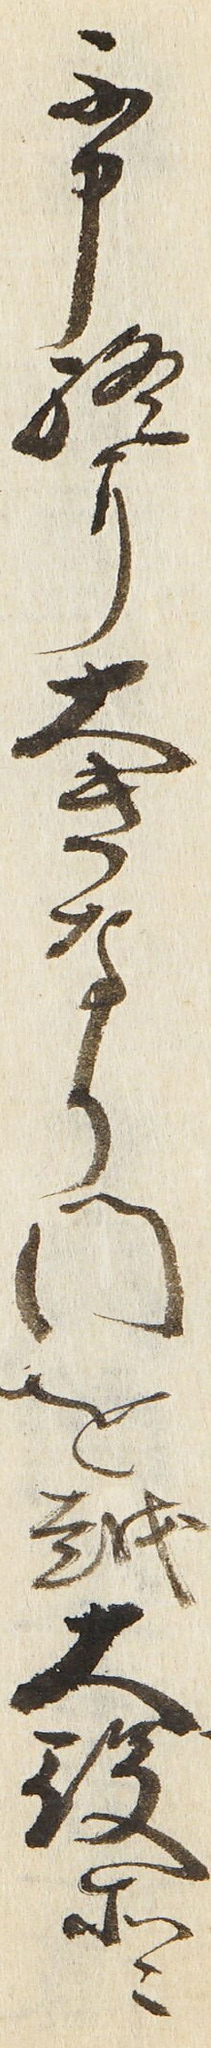不申終に大きなる門を越大役所に
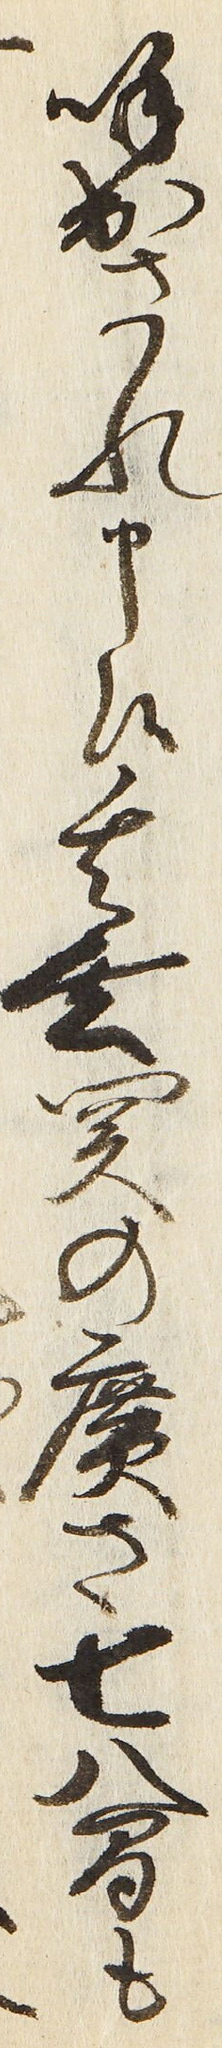呼出され申候其玄関の広さ七八間も
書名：天保漂流記
